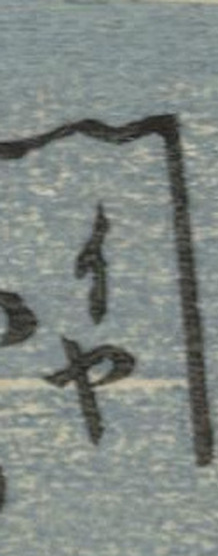〽イヤ
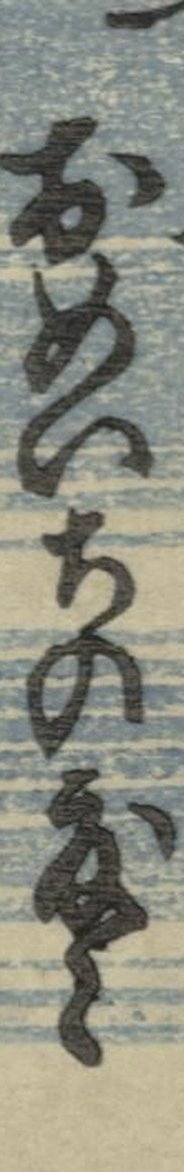おめいちの度々
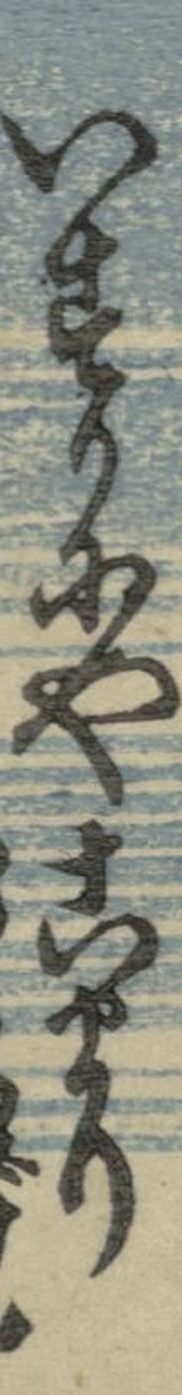いすりにやこまり
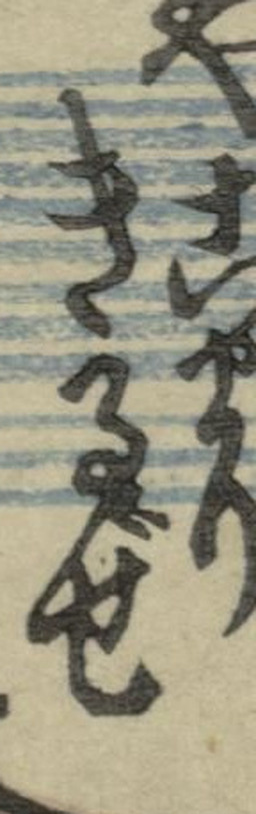きるぜ
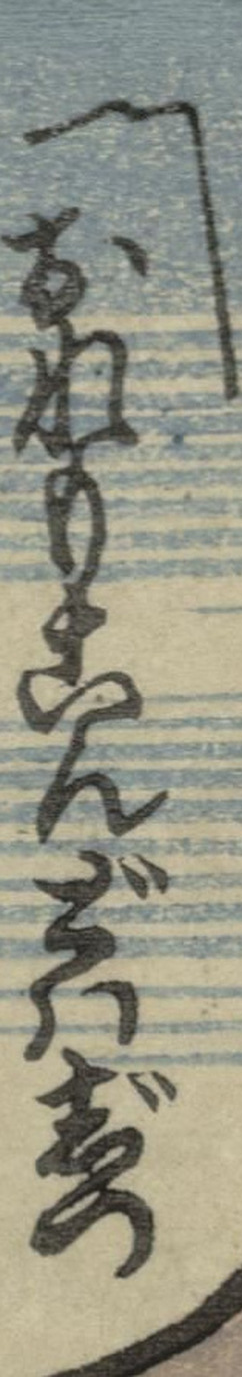〽おれもこんどはじつ
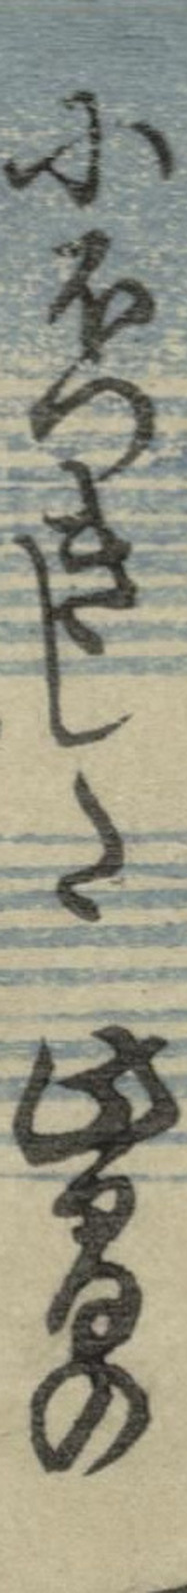にほつきした此間の
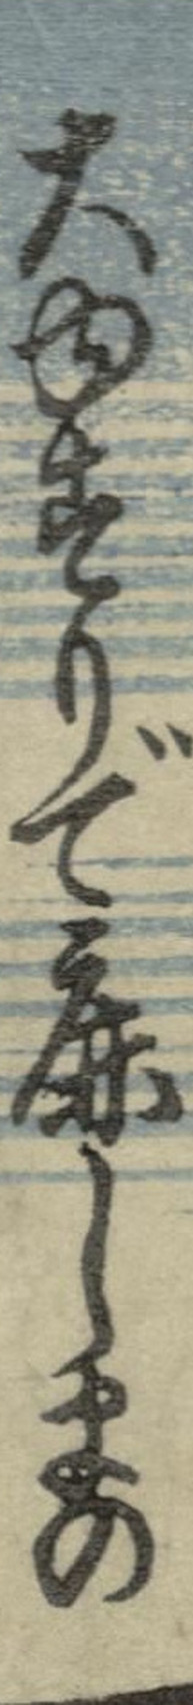大ゆすりで鹿しまの
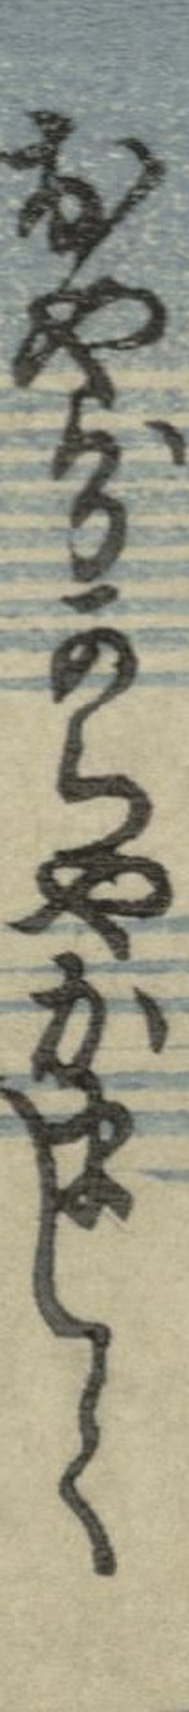おや分からやかましく
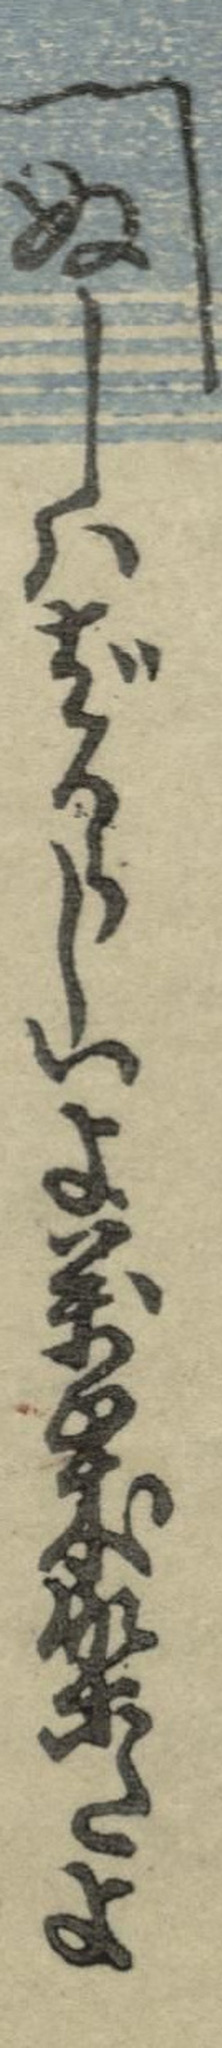〽ぬしはばからしいよ萬歳楽たよ
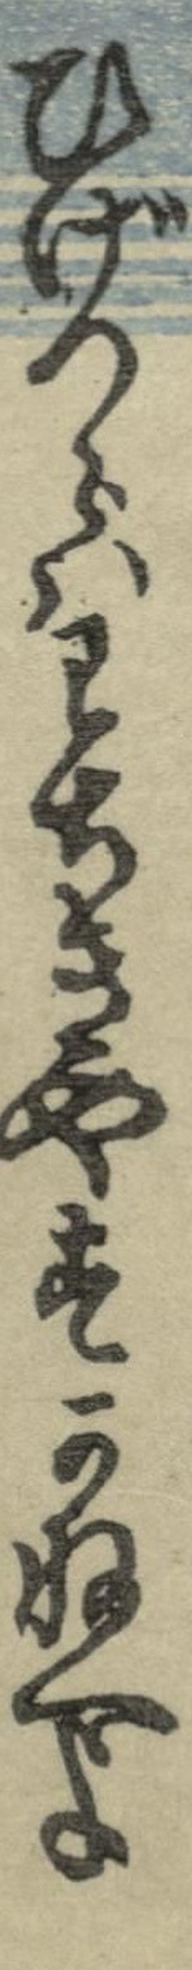〽ひげつらはわちきやすかねへよ
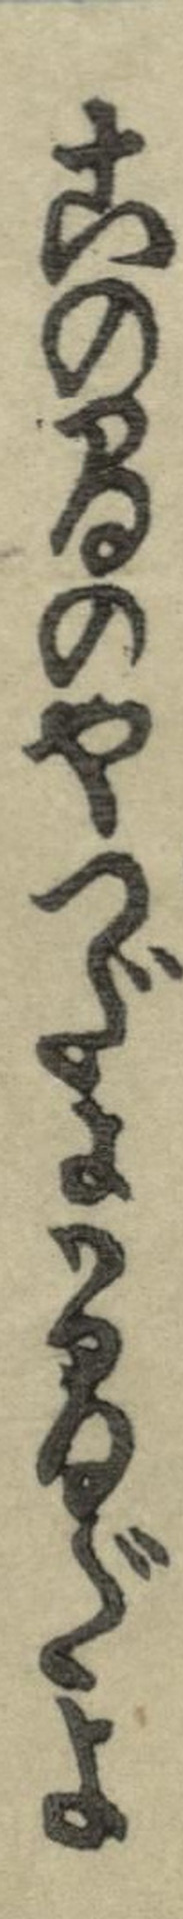この間のやつだよ御間だよ
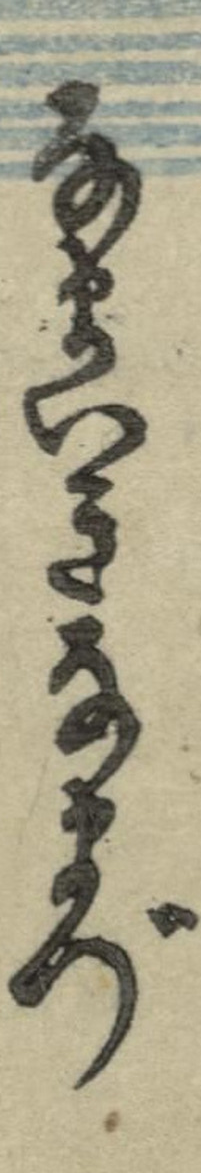なまいきなまづ
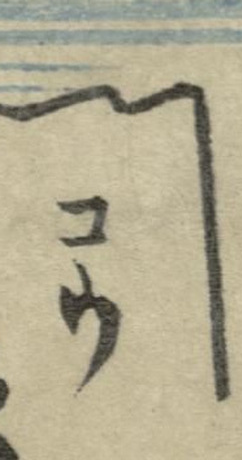〽コウ
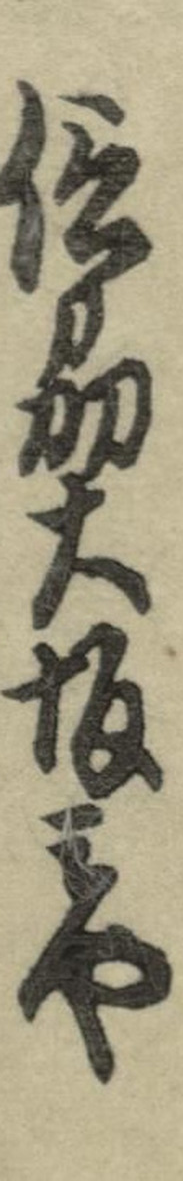信州大坂みや
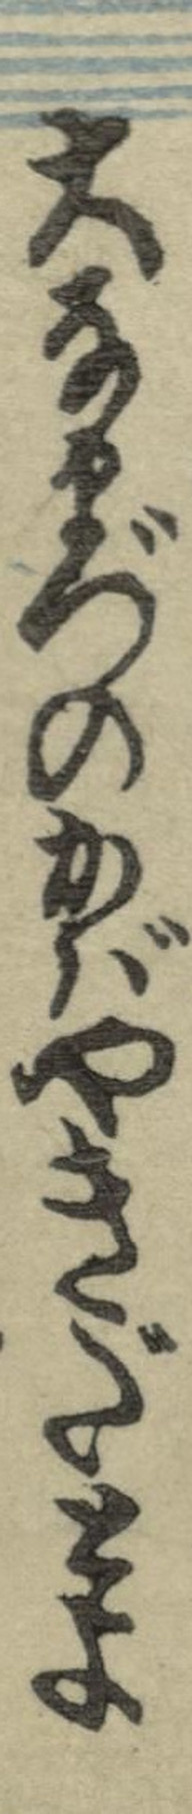大なまづのかばやきだとよ
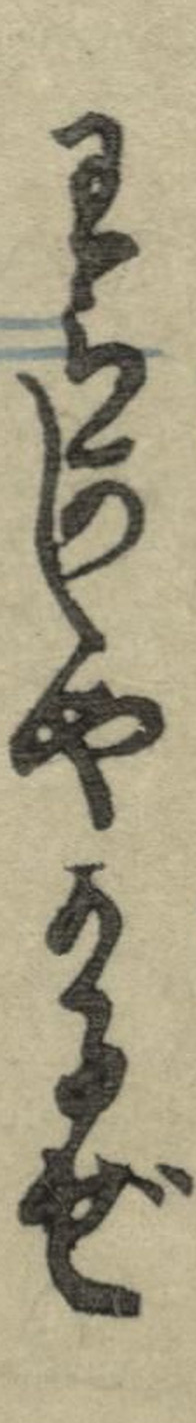わらかしやかるぜ
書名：なんぢうやかぢ仮宅
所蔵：東京大学地震研究所図書室 Earthquake Research Institute Library, The University of Tokyo, JAPAN
